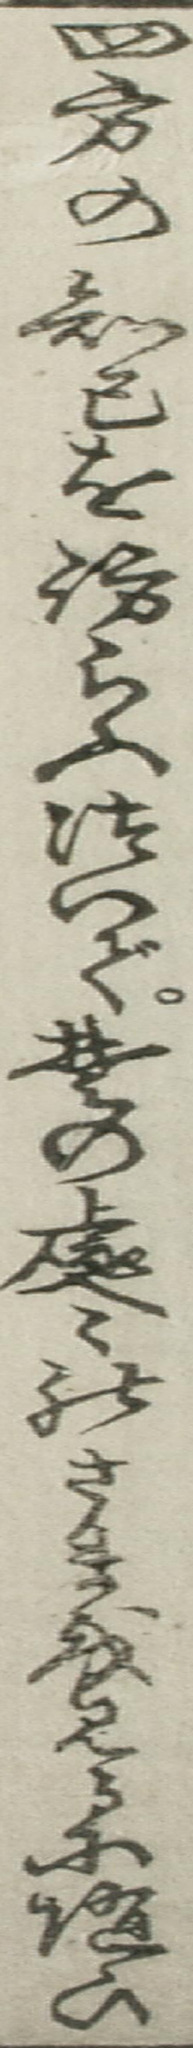四方の知己を訪らふついで。その処〻のさまを見るに随ひ
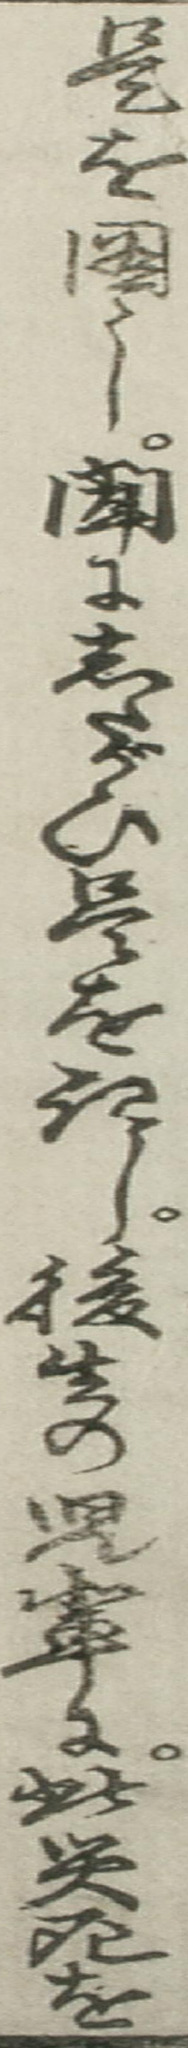是を図し。聞にしたがひ是を記し。後生の児輩に。此災厄を
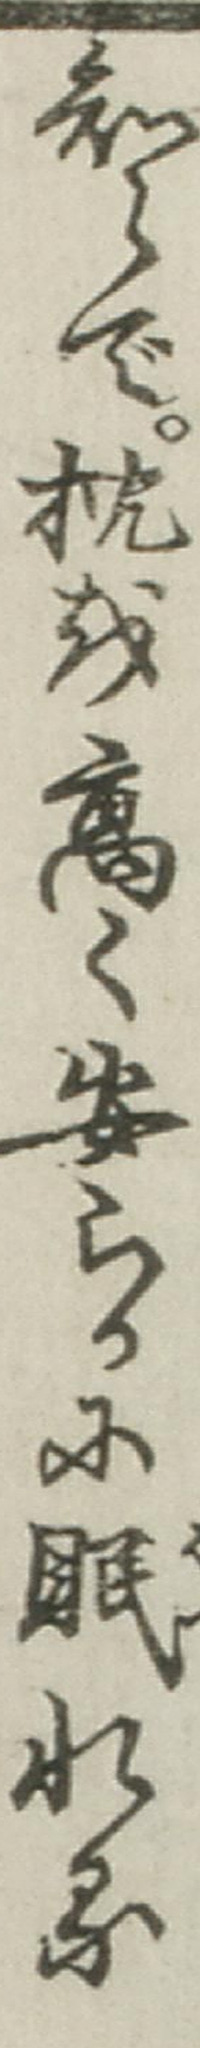知らで。枕を高く安らかに眠れる
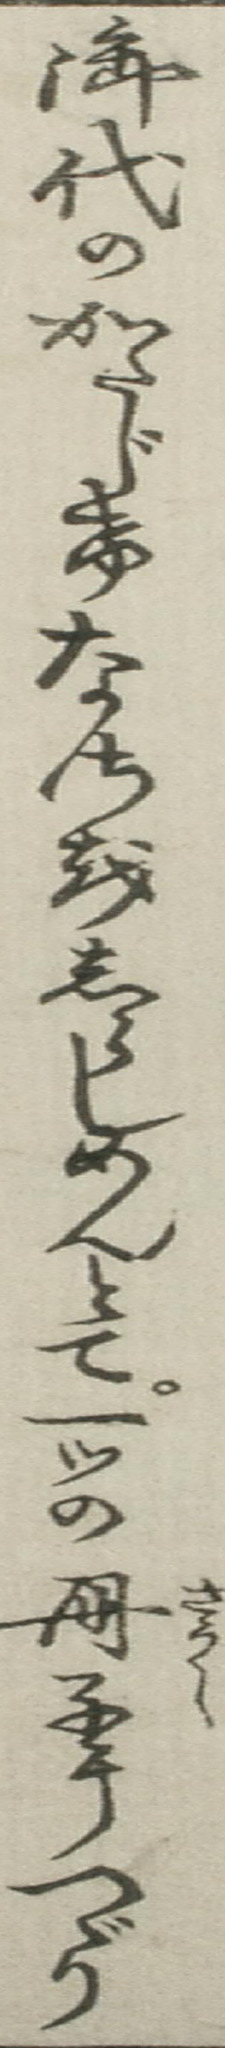御代のかたじけなさをしらしめんとて。一ツの冊子につゞり
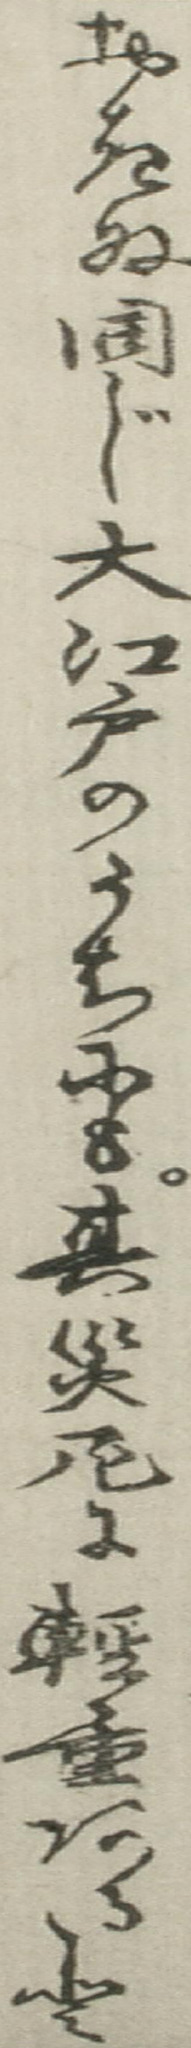おきぬ同じ大江戸のうちにも。其災厄に軽重あること
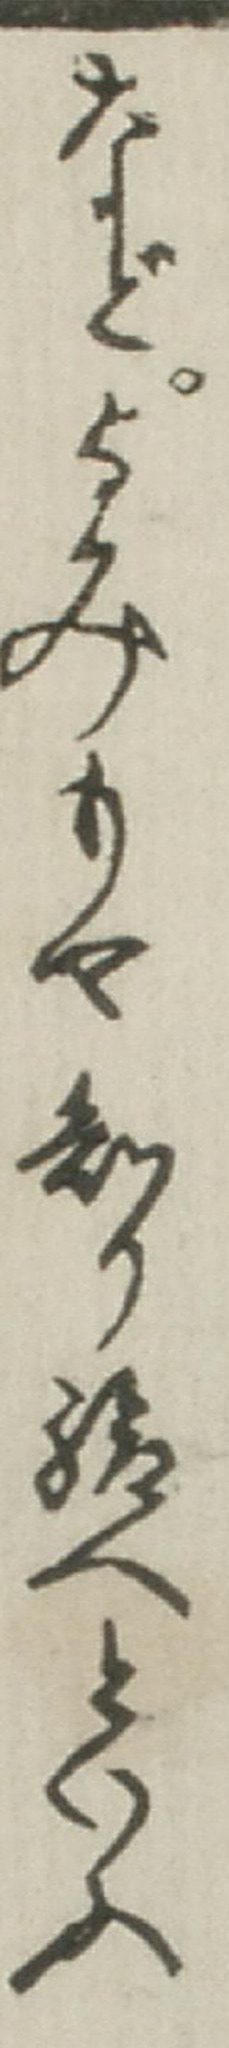など。よみもて知り給へといふ
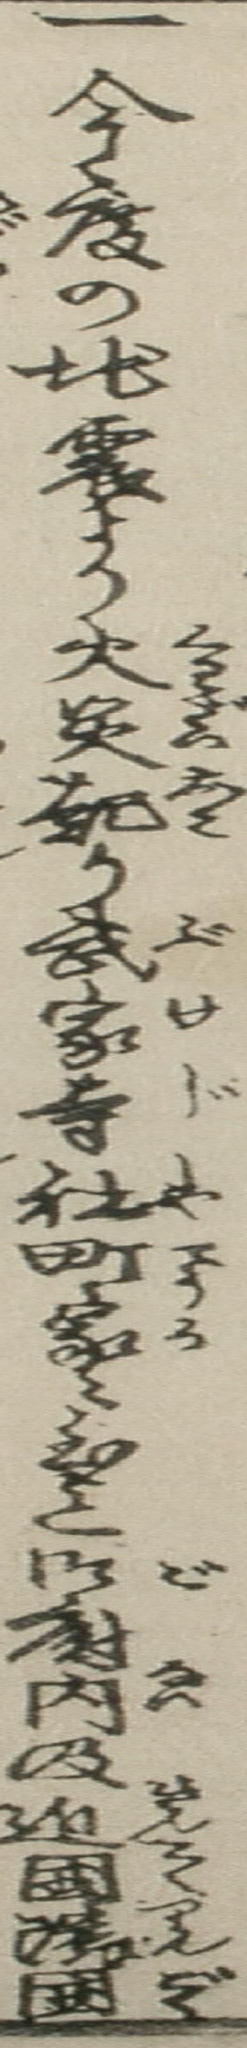一今度の地震より火災起り武家寺社町家に至迄御府内及近国隣国
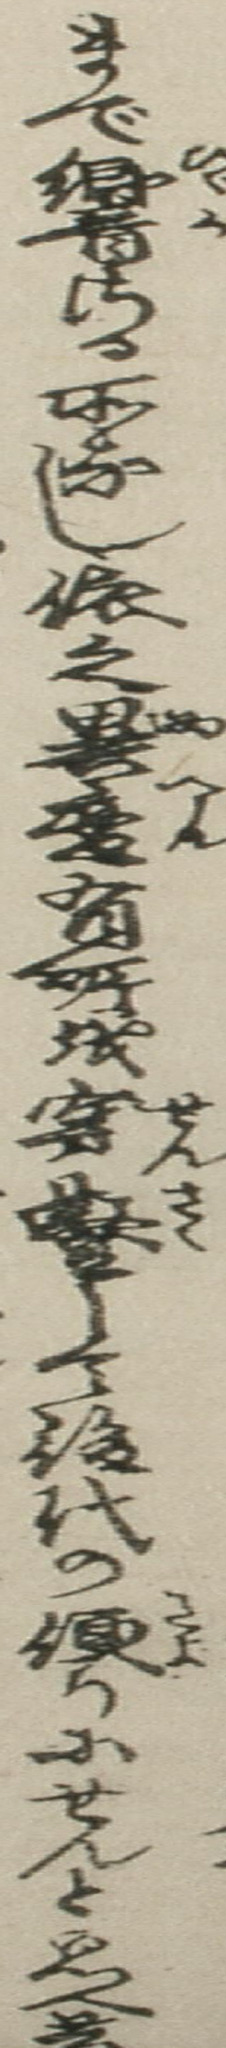まで響さる所なし依之異変有所を穿鑿して後代の便りにせんと思へ共
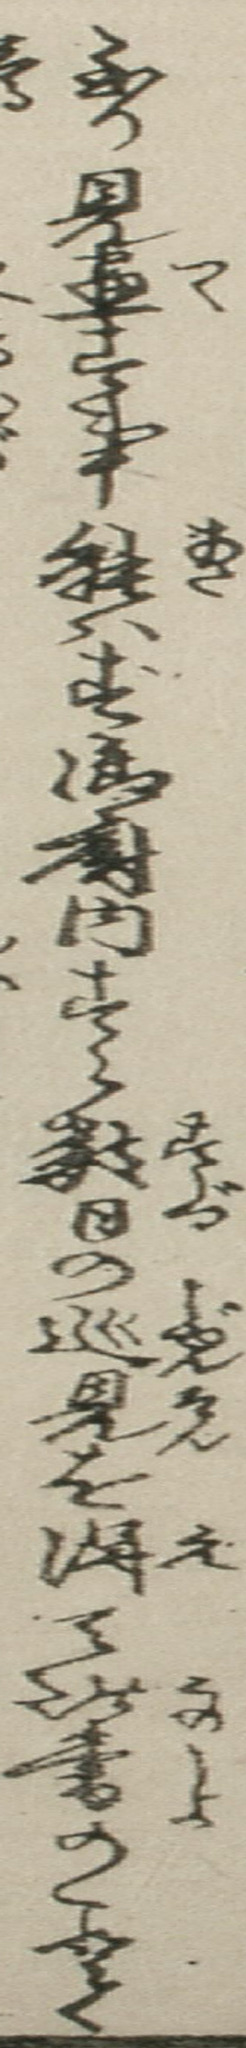至り見尽す事能はす御府内すら数日の巡見を得て此書のことく
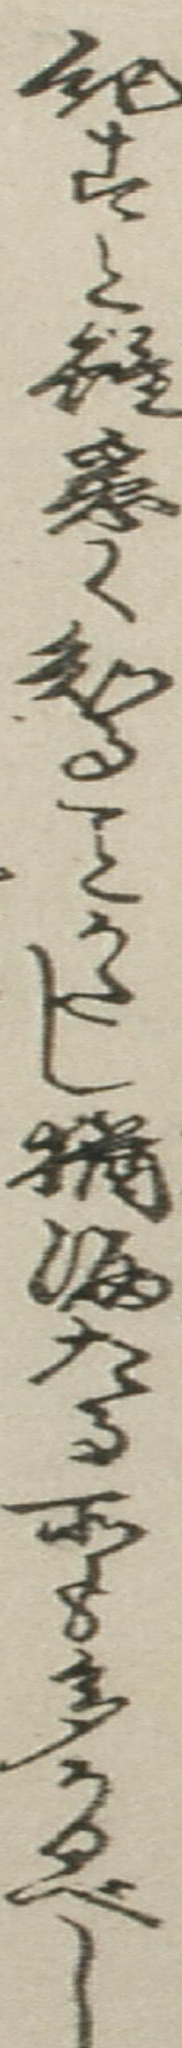記すと雖悉く知ることかたし猶漏たる所も多かるべし
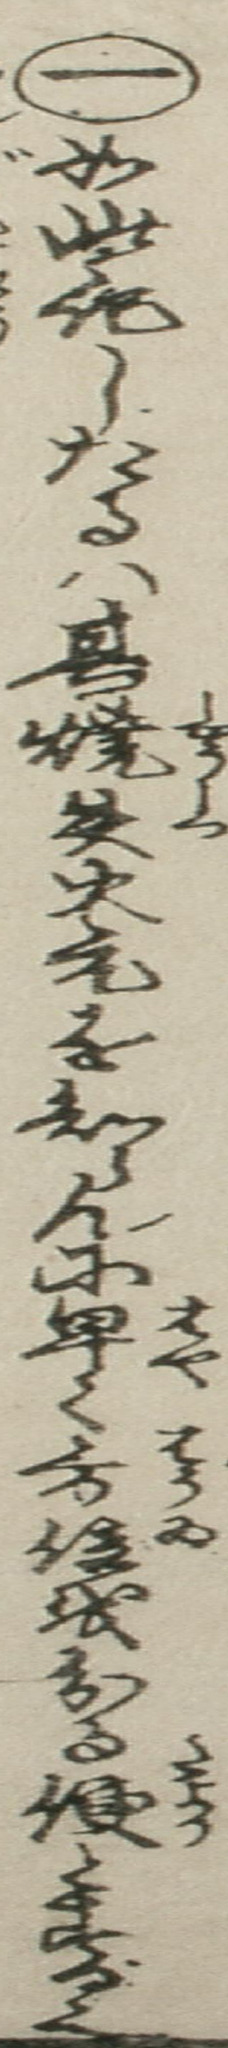一如此記したるは其焼失火元を知らんに早く方位を分る便とする也
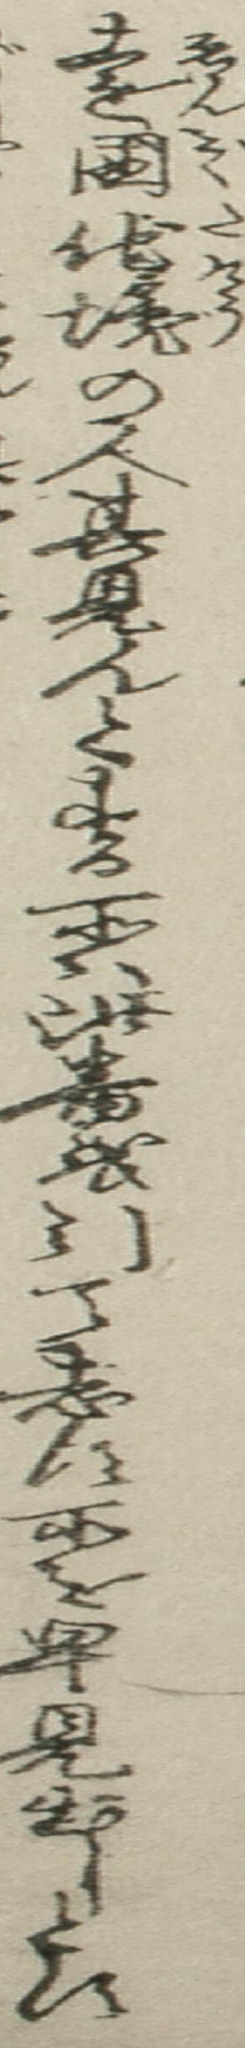遠国他境の人其見んとする所は此番を引て志す所を早見出しとす
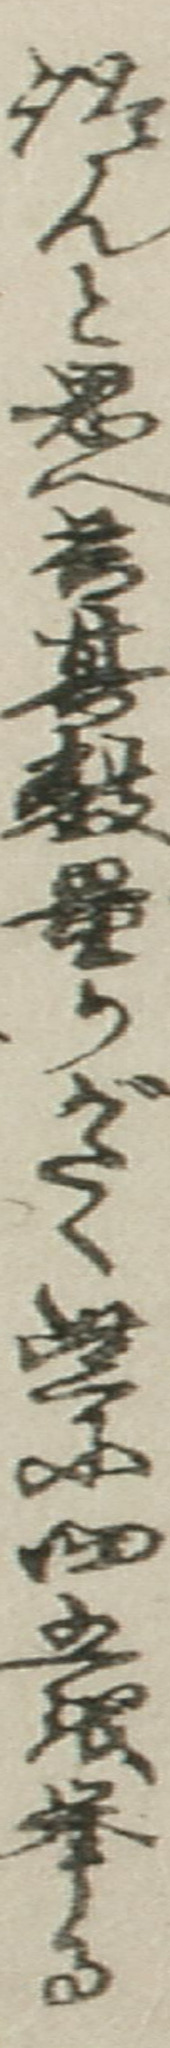語んと思へ共其数量りがたく些に四五を挙る
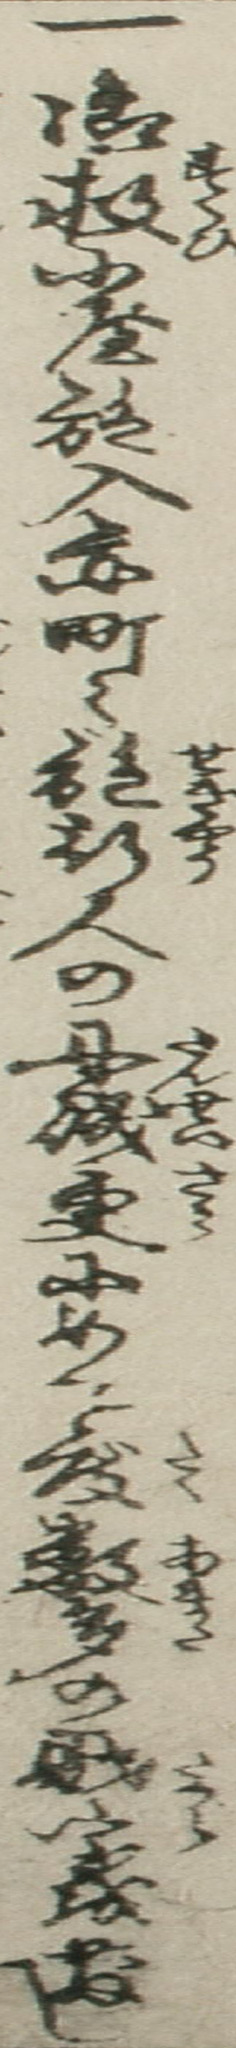一御救小屋施入亦町〻施行人の丹誠更にめて度数多の財宝を散し
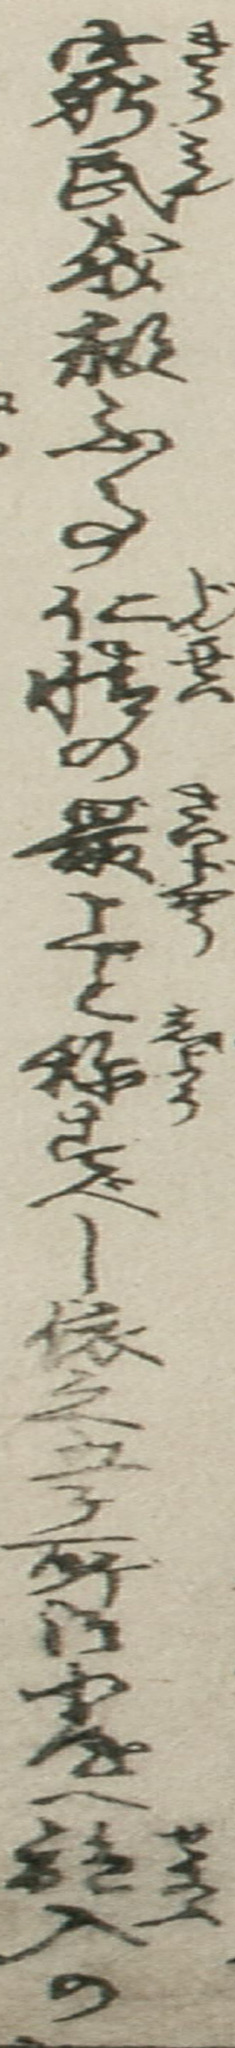窮民を赦ふ事仁性の最上と称すべし依之五ヶ所御小屋へ施入の
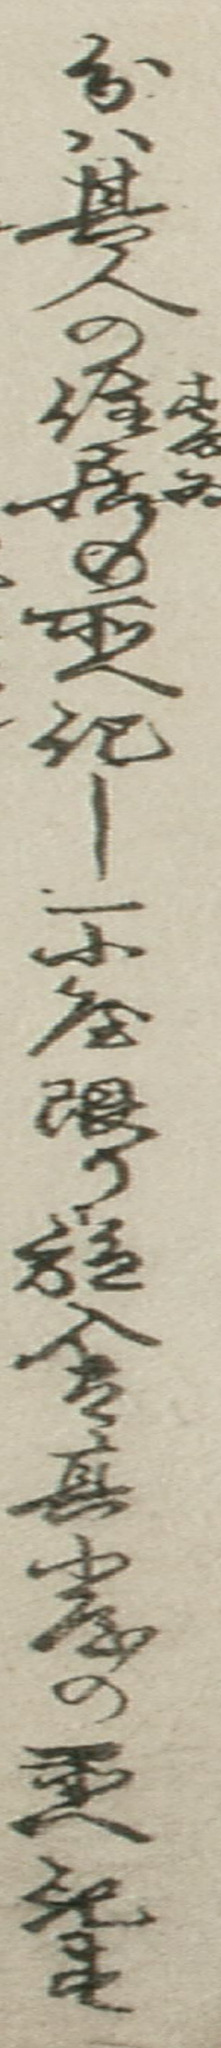分は其人の住居の所へ記し一小屋限り施入は其小屋の所へ記す
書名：安政見聞誌　上
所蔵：東京大学地震研究所図書室 Earthquake Research Institute Library, The University of Tokyo, JAPAN
